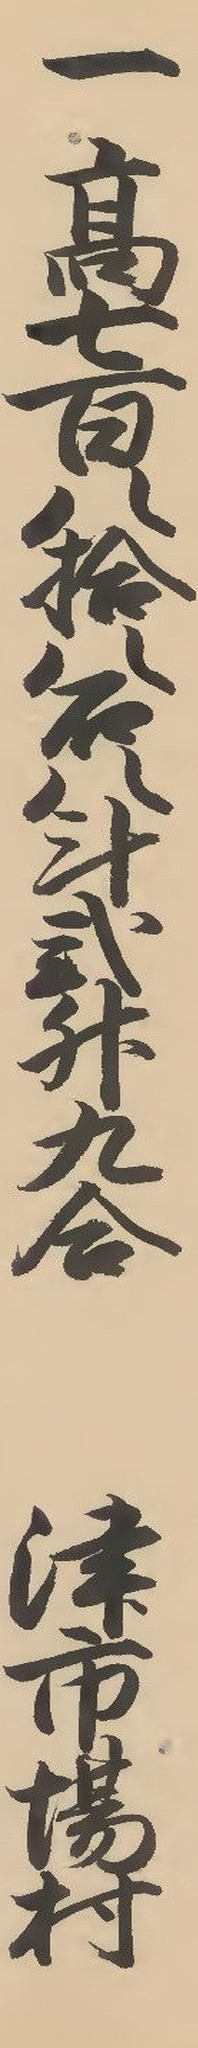一髙七百八拾八石八斗弐升九合津市場村
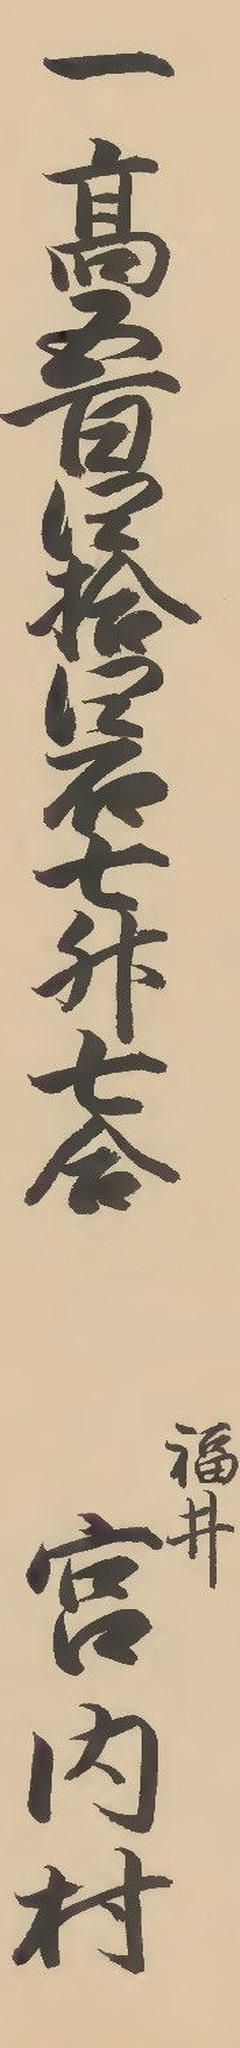一髙五百四拾四石七升七合宮内村

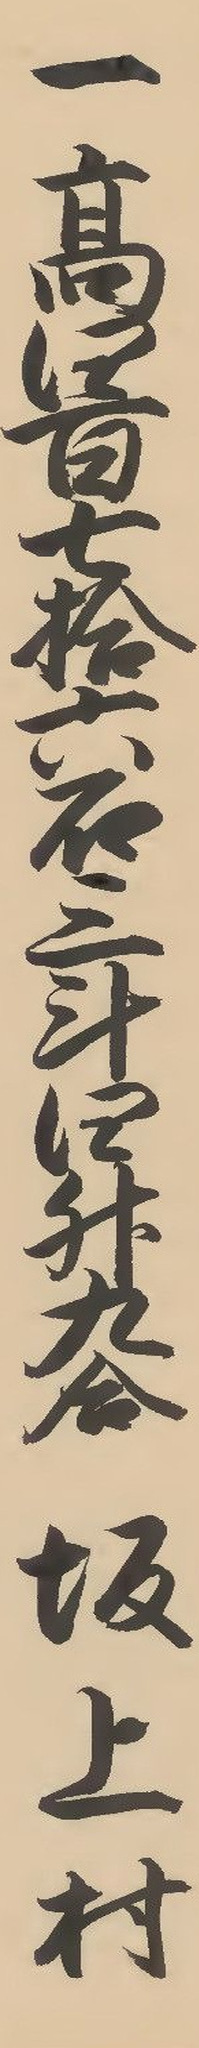一髙四百七拾六石三斗四升九合坂上村
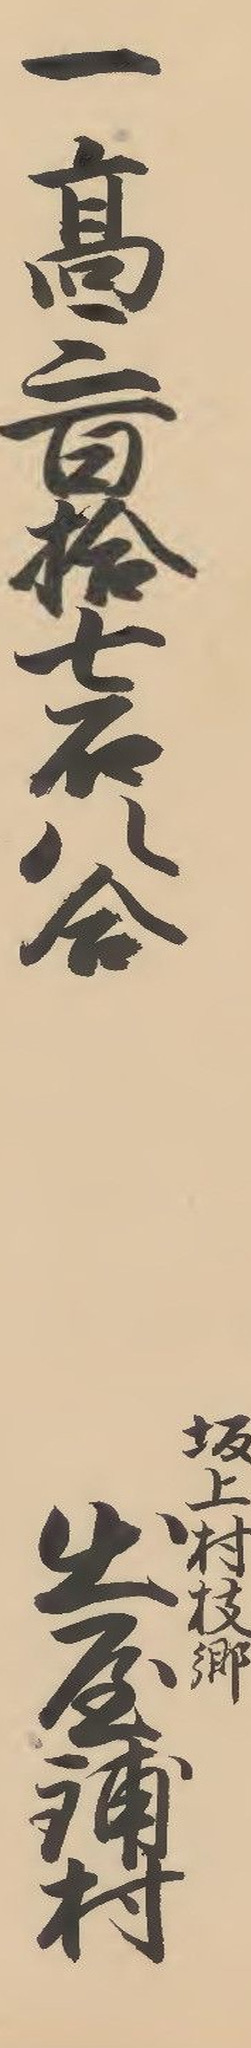一髙三百拾七石八合出屋鋪村
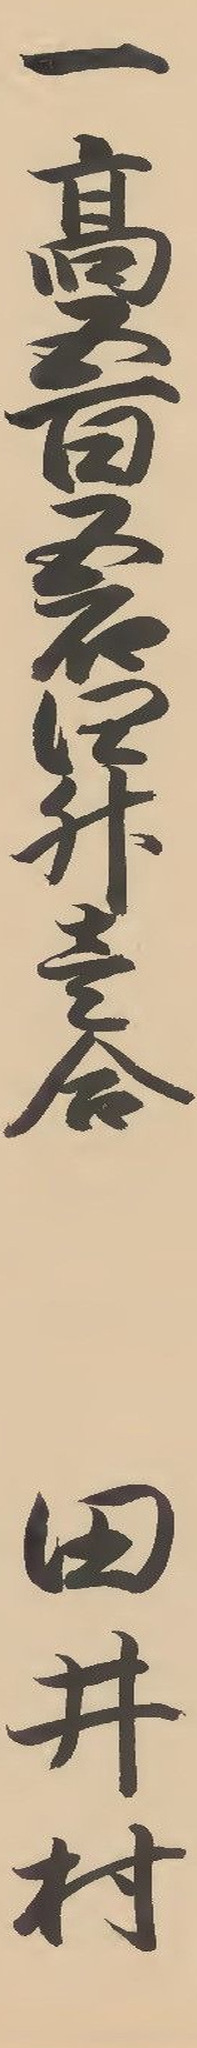一髙五百五石四升壱合田井村
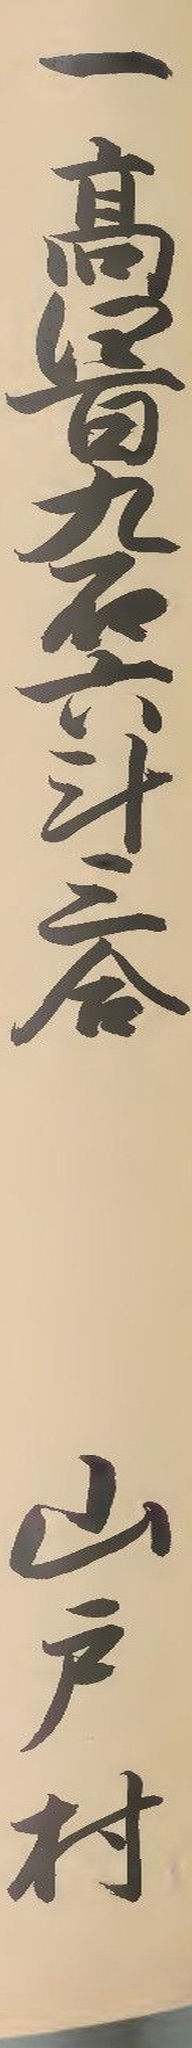一髙四百九石六斗三合山戸村
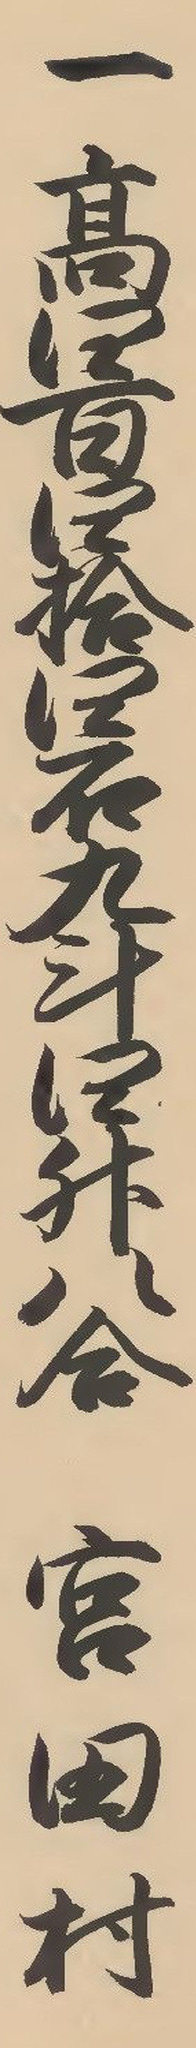一髙四百四拾四石九斗四升八合宮田村
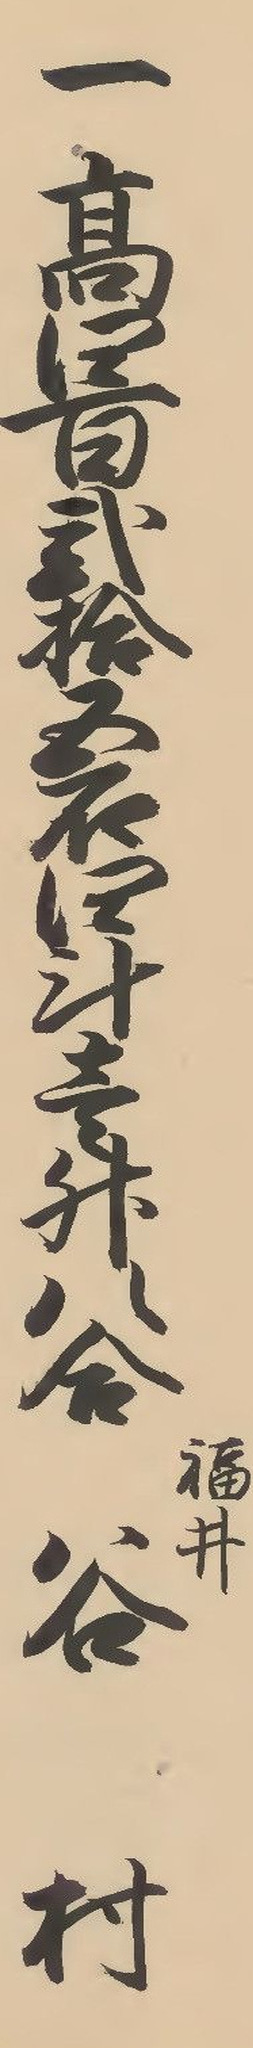一髙四百弐拾五石四斗壱升八合谷村
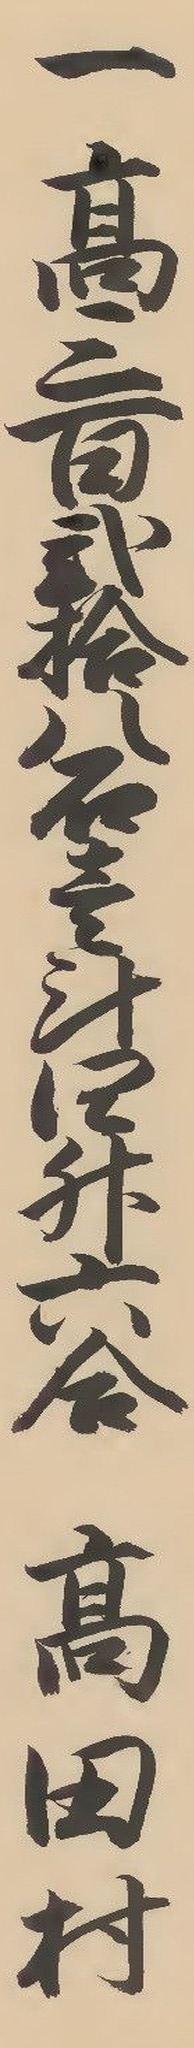一髙三百弐拾八石壱斗四升六合髙田村

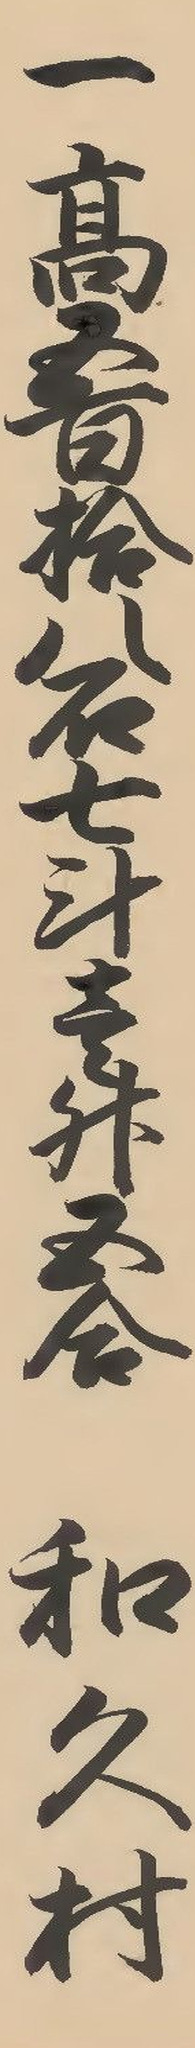一髙五百拾八石七斗壱升五合和久村
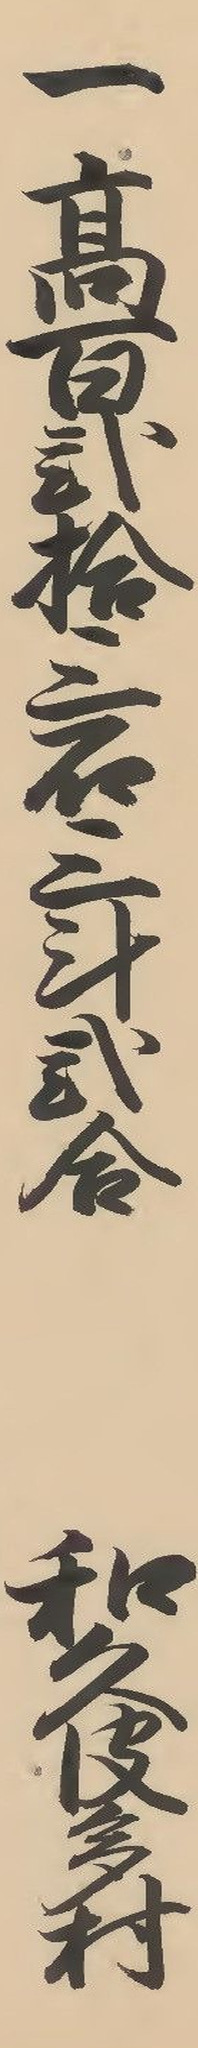一髙百弐拾三石三斗弐合和久皮多村
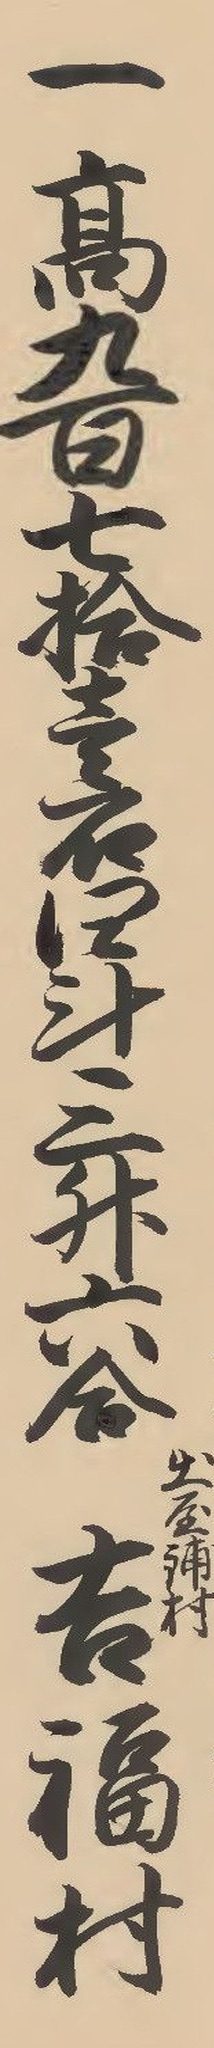一髙九百七拾壱石四斗三升六合吉福村
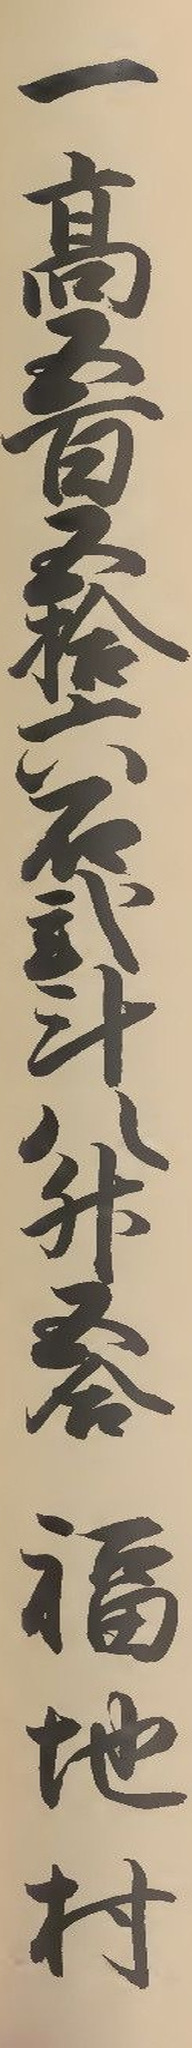一髙五百五拾六石弐斗八升五合福地村
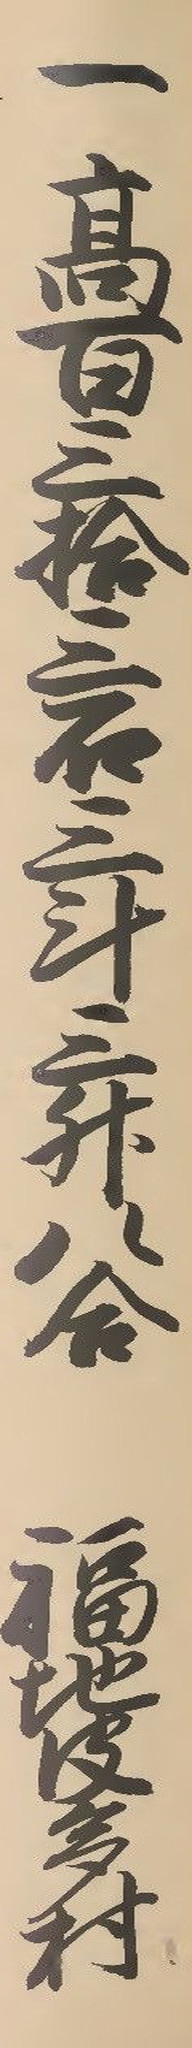一髙百三拾三石三斗三升八合福地皮多村
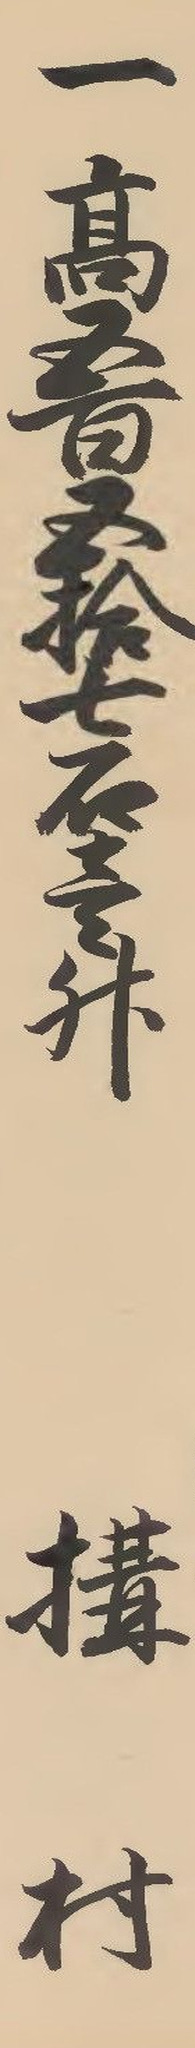一髙五百五拾七石壱升構村
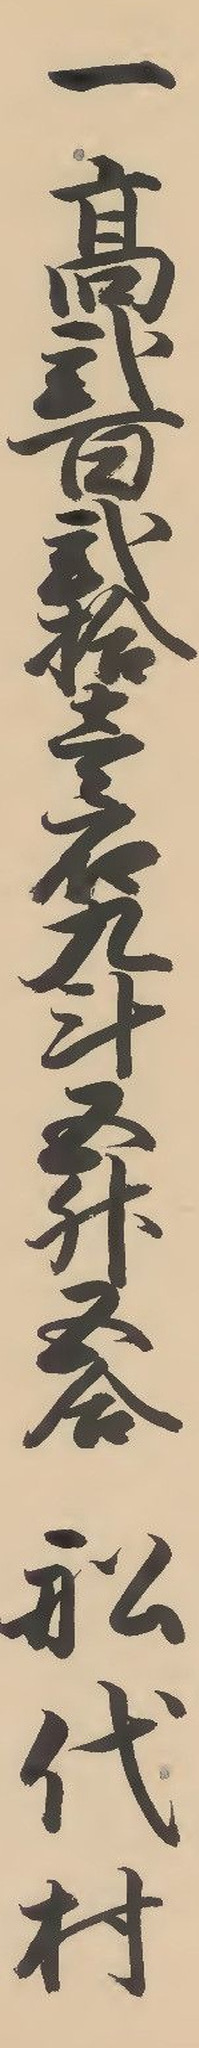一髙弐百弐拾壱石九斗五升五合舩代村
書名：播磨国郷帳
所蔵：国立公文書館 National Archives of Japan
